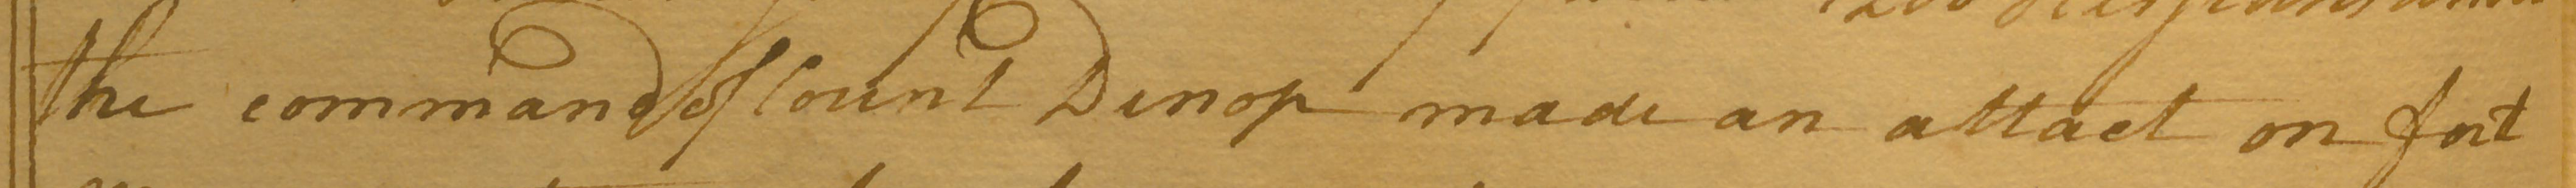the command of Count Dinop made an attack on fort
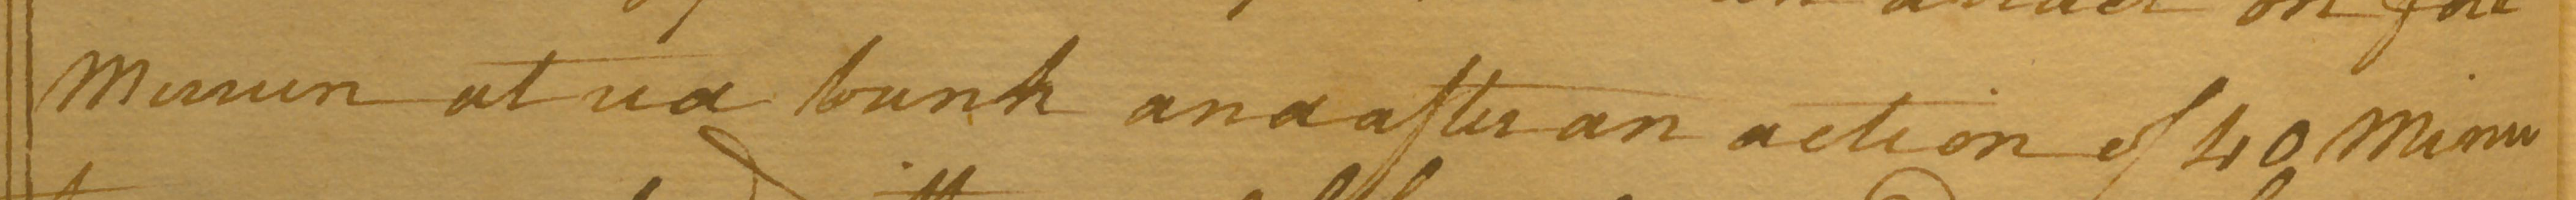Merrcer at red bank and after an action of 40 Minu
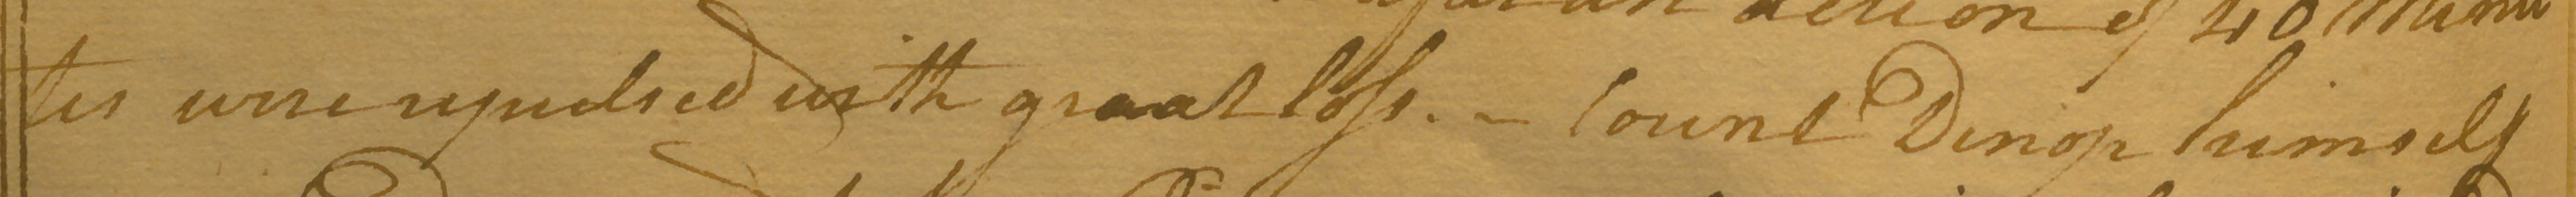tes were repulsed with great loss. Count Dinop himself
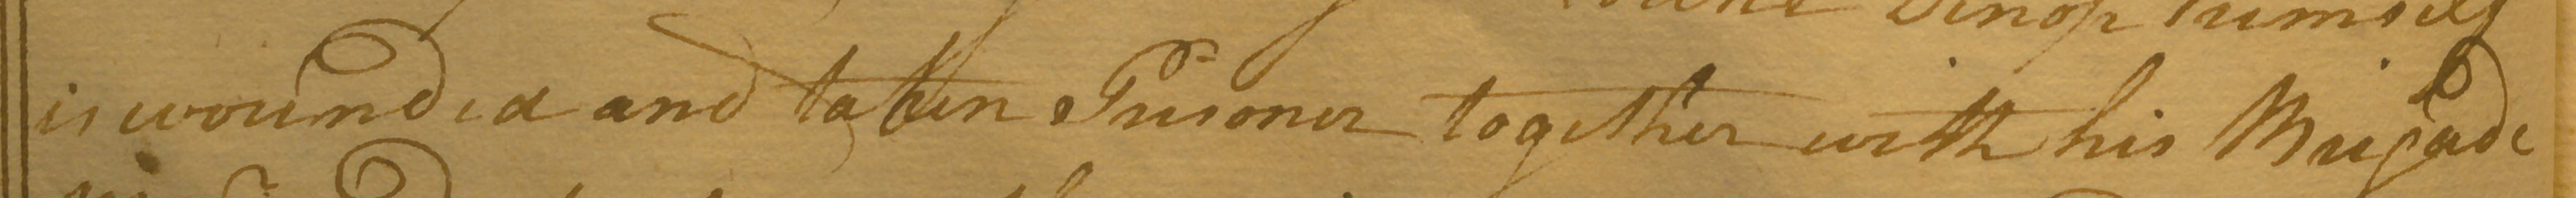is wounded and taken Prisoner together with his Brigade
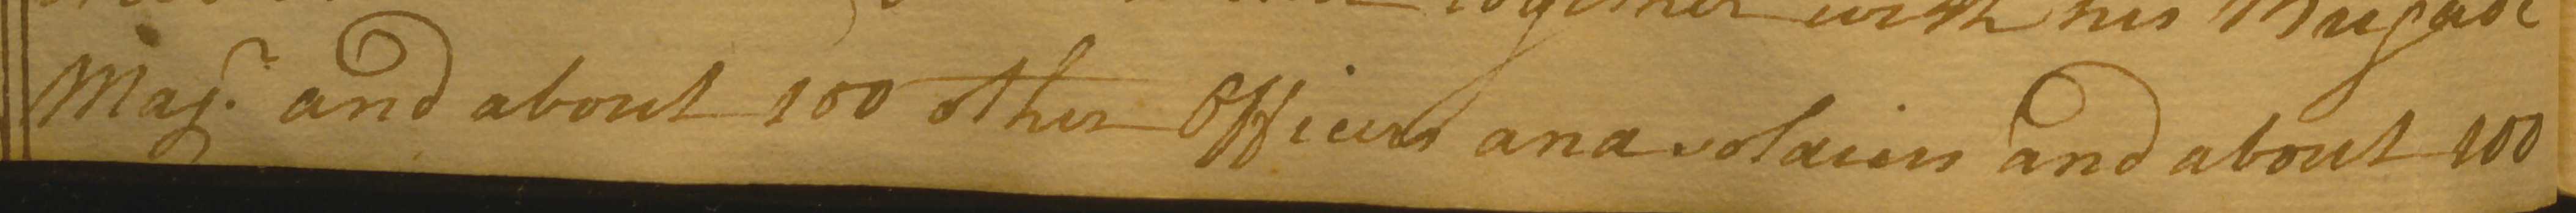Maj^r. and about 100 other Officers and soldiers and about 100
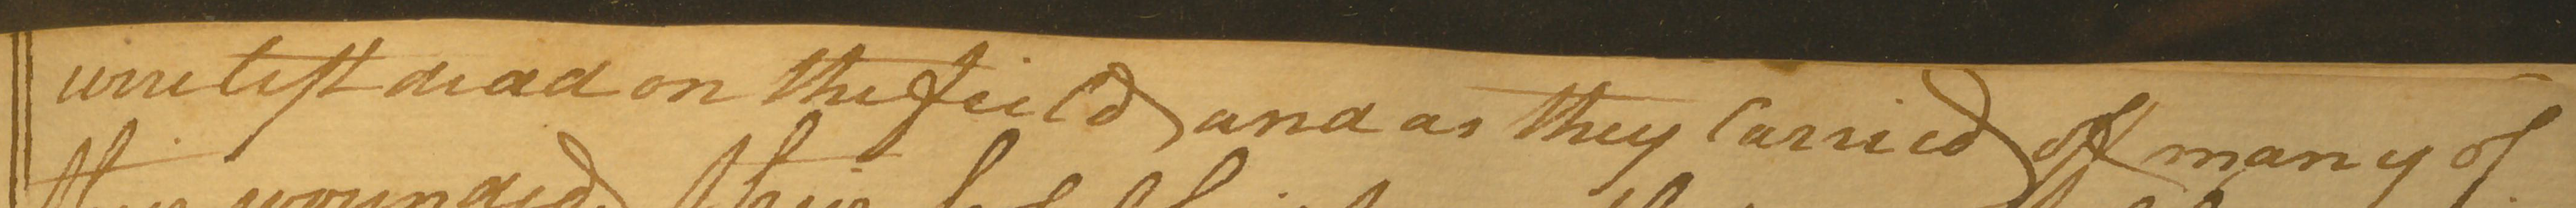were left dead on the field and as they carried off many of
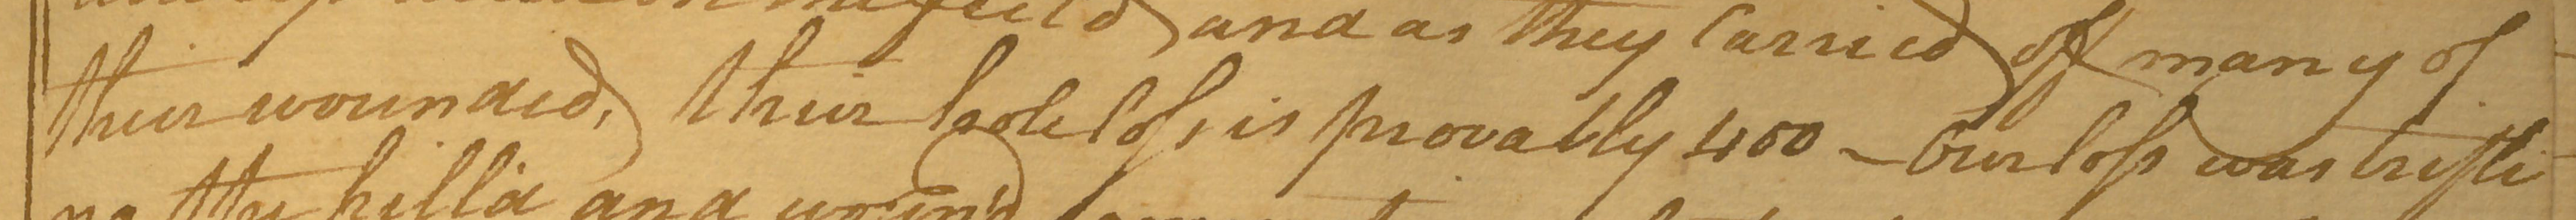their wounded, their hole loss is probably 400- our loss was trifli
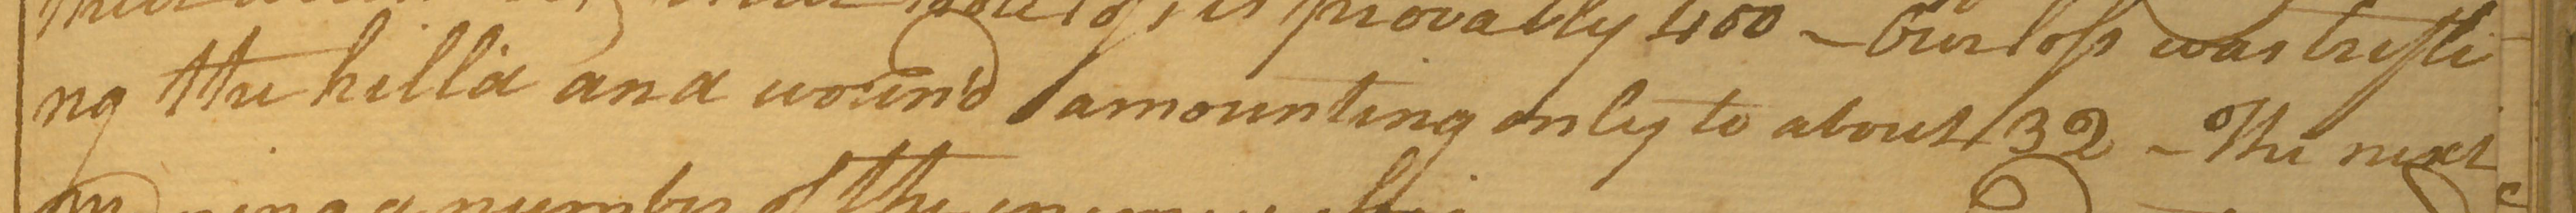ng the kill'd and woun'd amounting only to about 32- The next
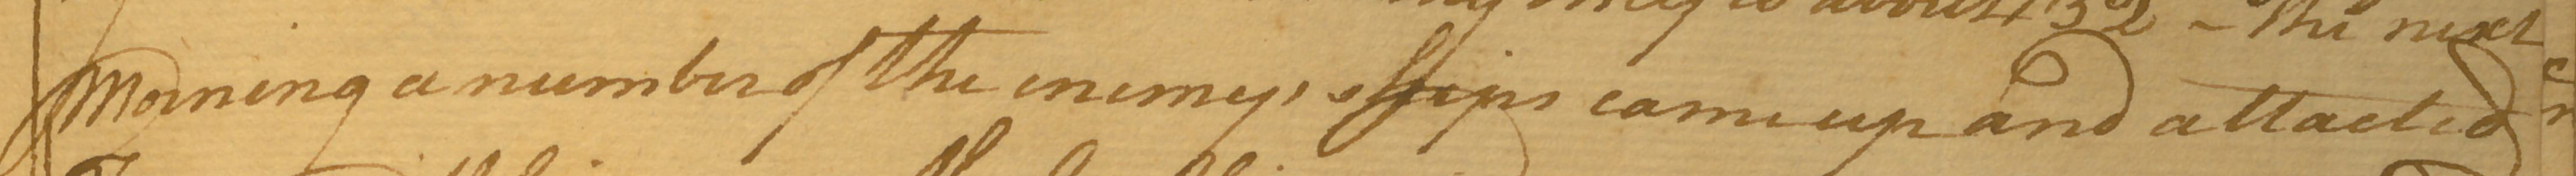morning a number of the enemys ships came up and attacked
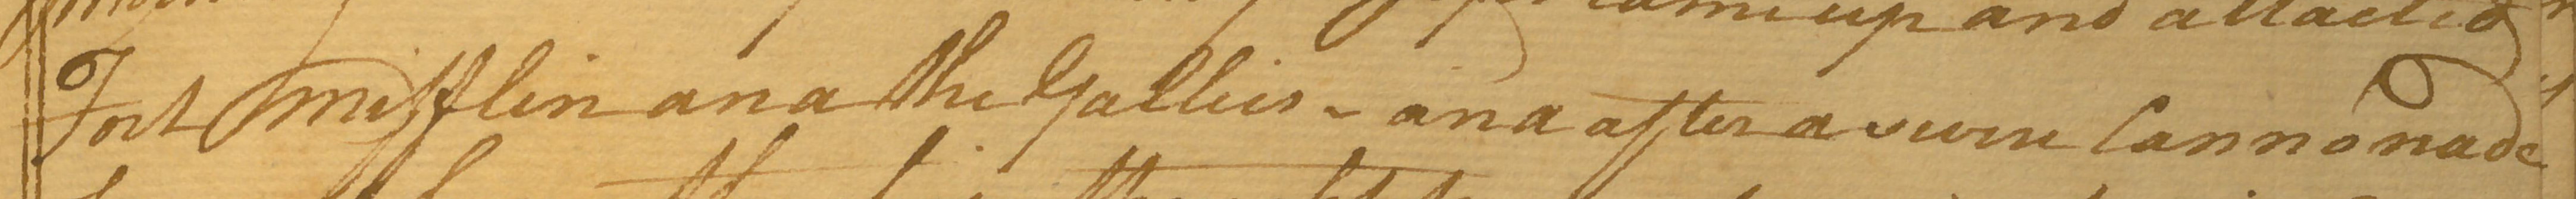Fort Mifflin and the Gallies- and after a severe Cannonade
